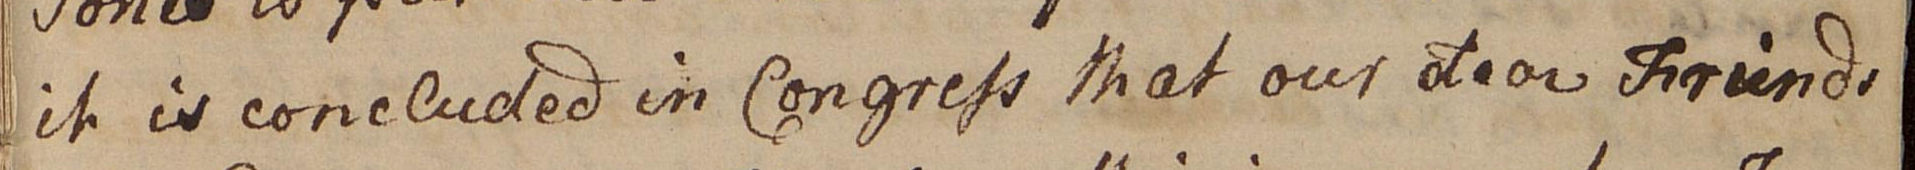it is concluded in Congress that our dear Friends
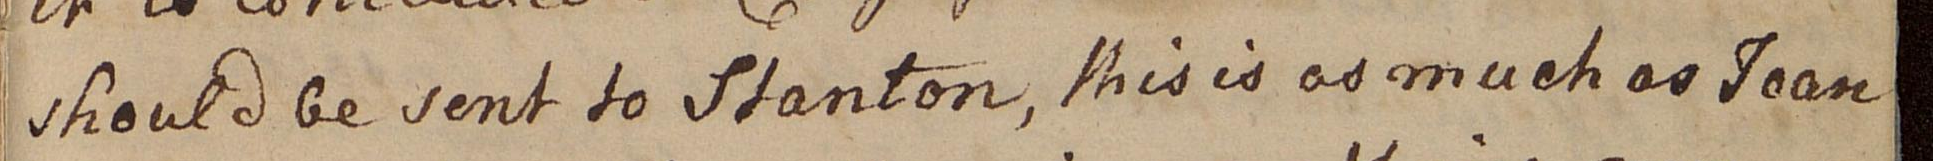should be sent to Stanton, this is as much as I can
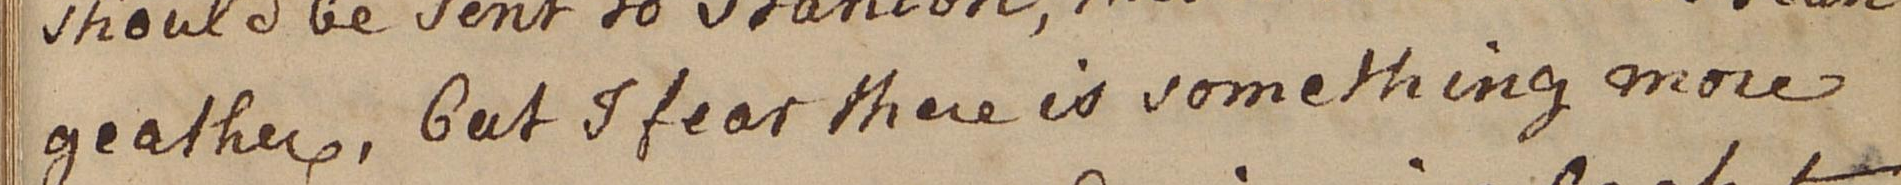geather, but I fear there is some thing more
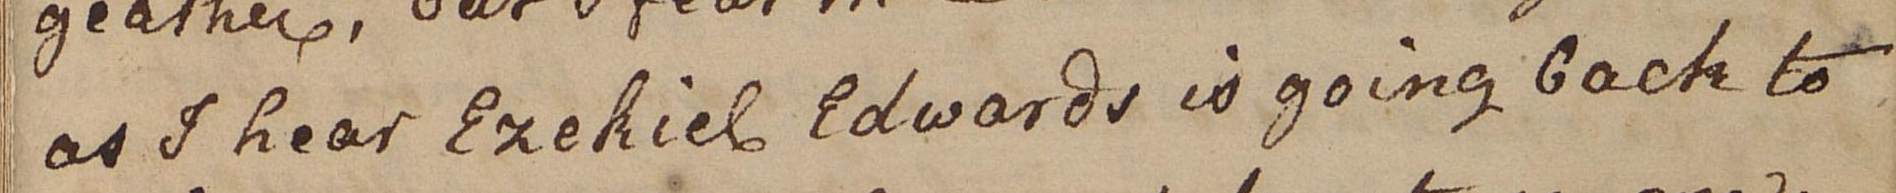as I hear Ezekiel Edwards is going back to
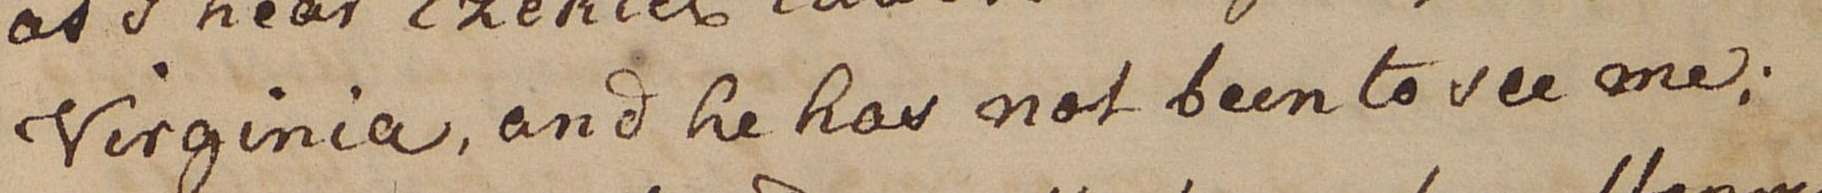Virginia, and he has not been to see me;
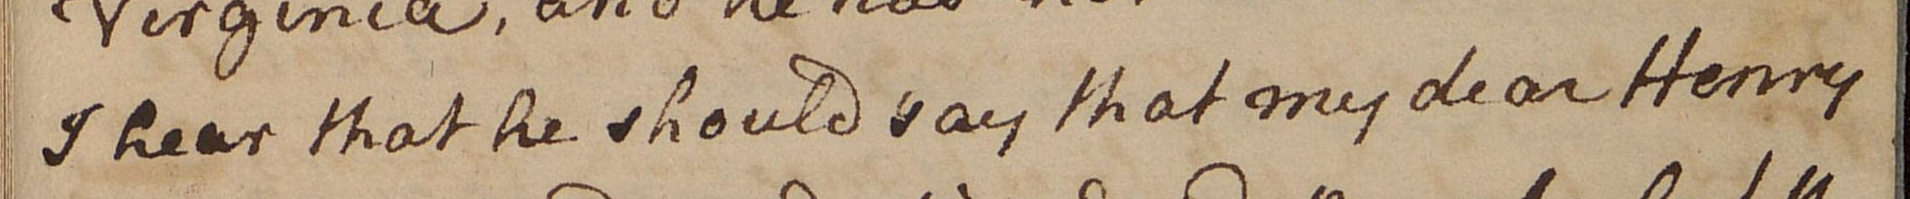I hear that he should say that my dear Henry
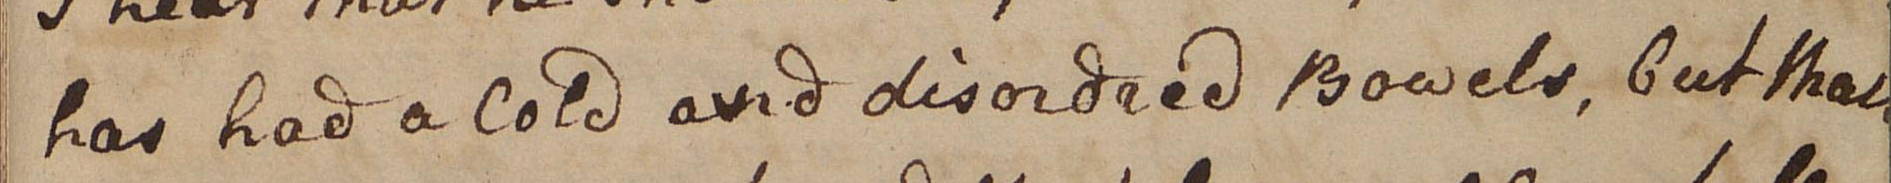has had a Cold and disordred Bowels, but that
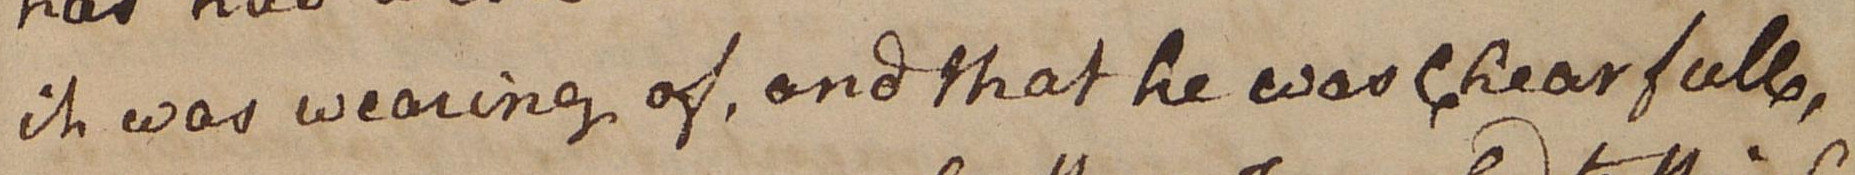it was wearing of, and that he was chear full,
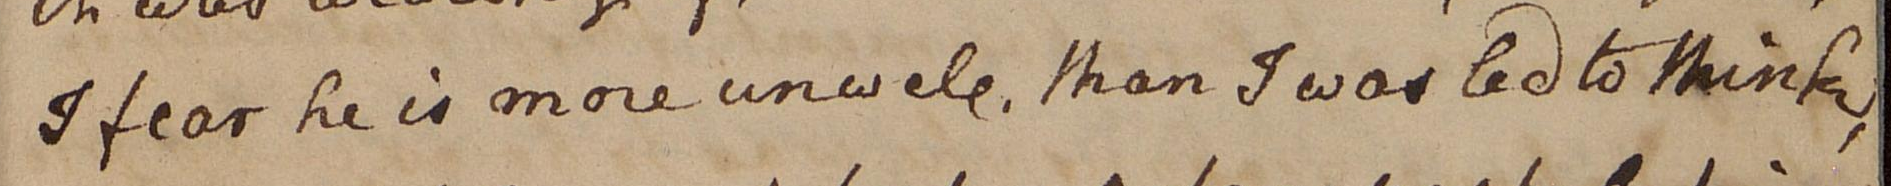I fear he is more unwell, than I was led to think,
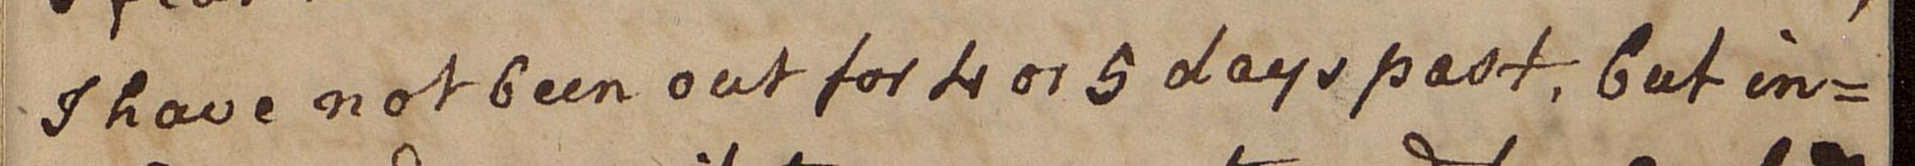I have not been out for 4 or 5 days past, but in-
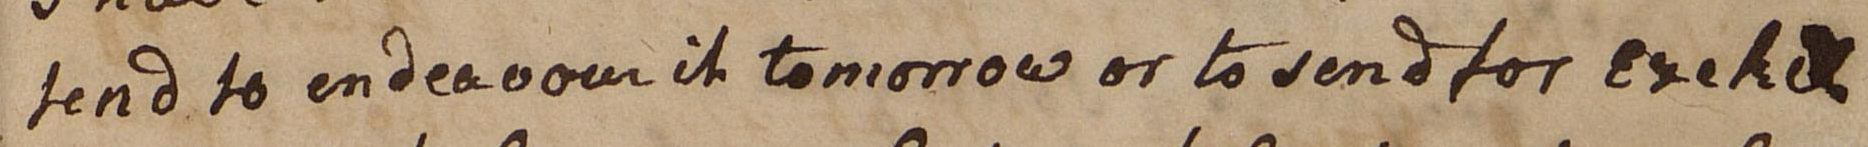tend to endeavour it tomorrow or to send for Ezekil
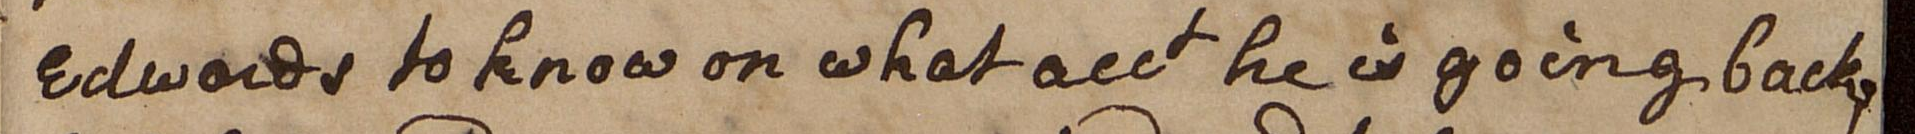Edwards to know on what acc^t he is going back
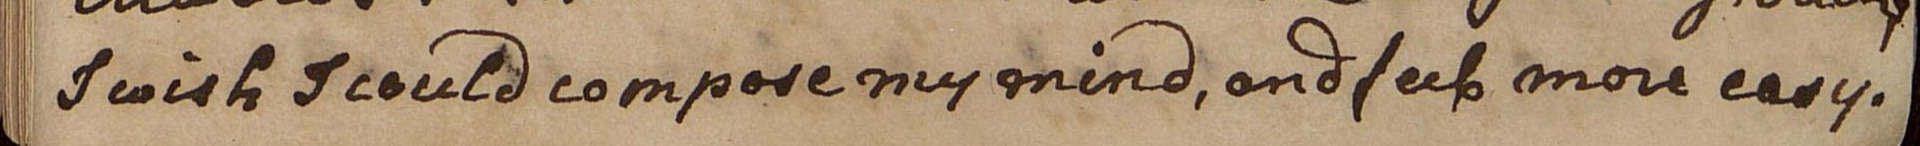I wish I could compose my mind, and feel more easy.
